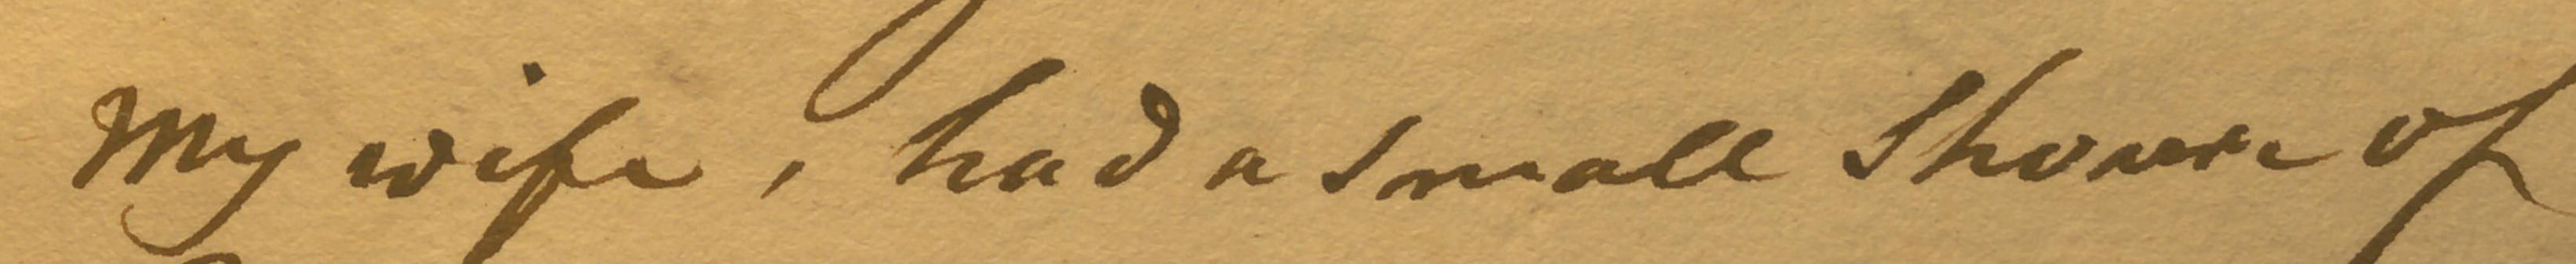My wife, had a small Shoure of
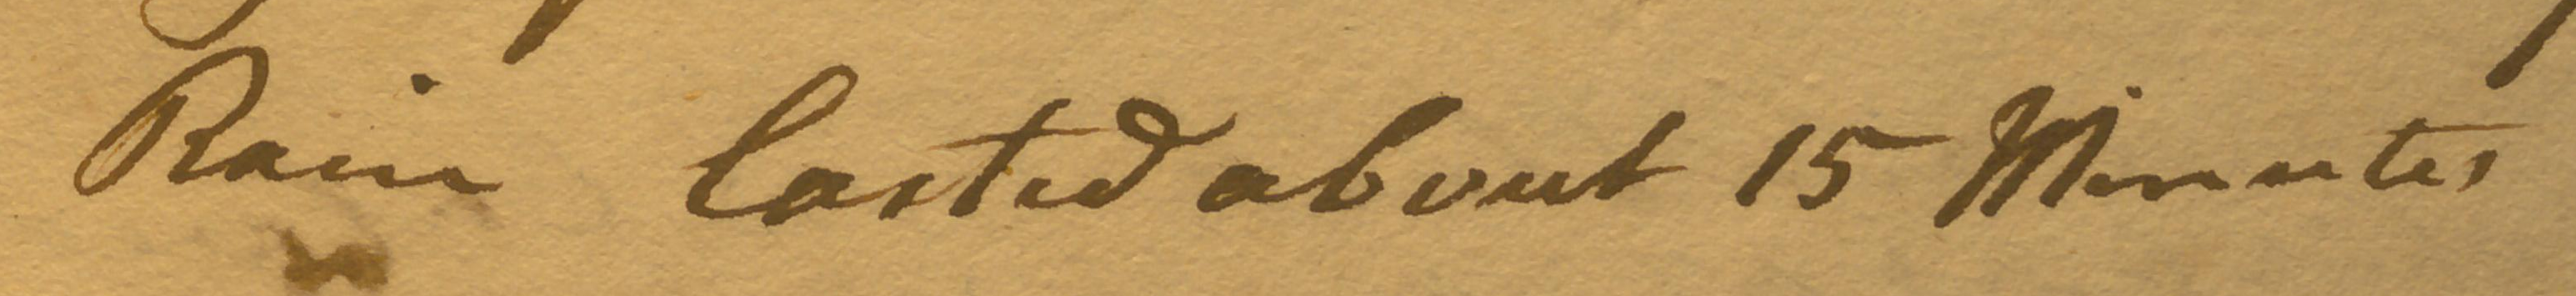Hain lasted about 15 Minutes
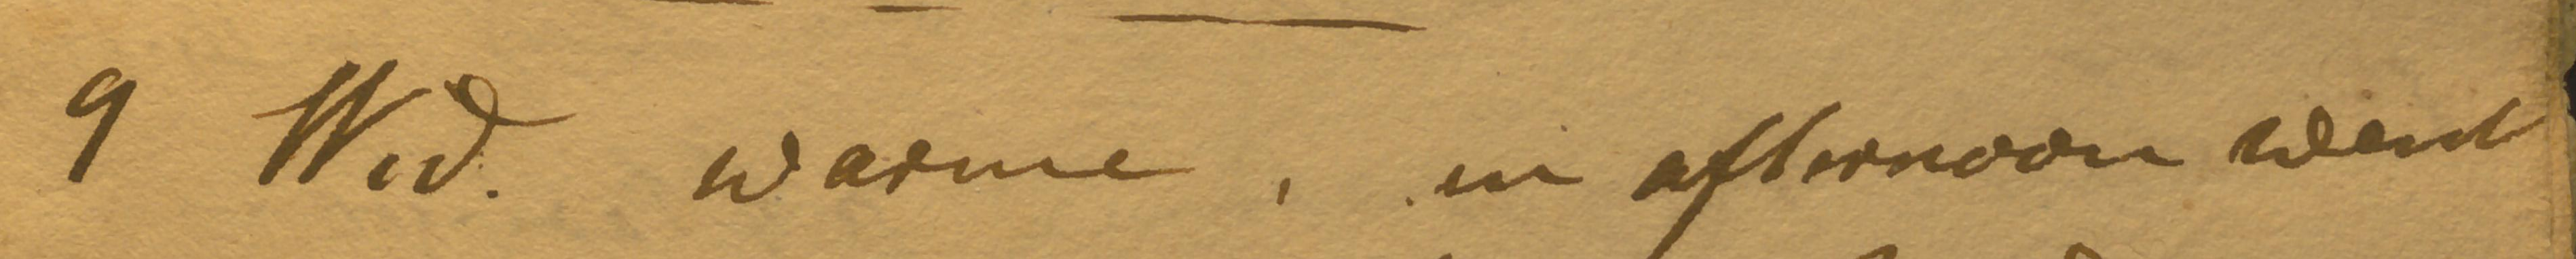9 Wed. warme, in afternoon went
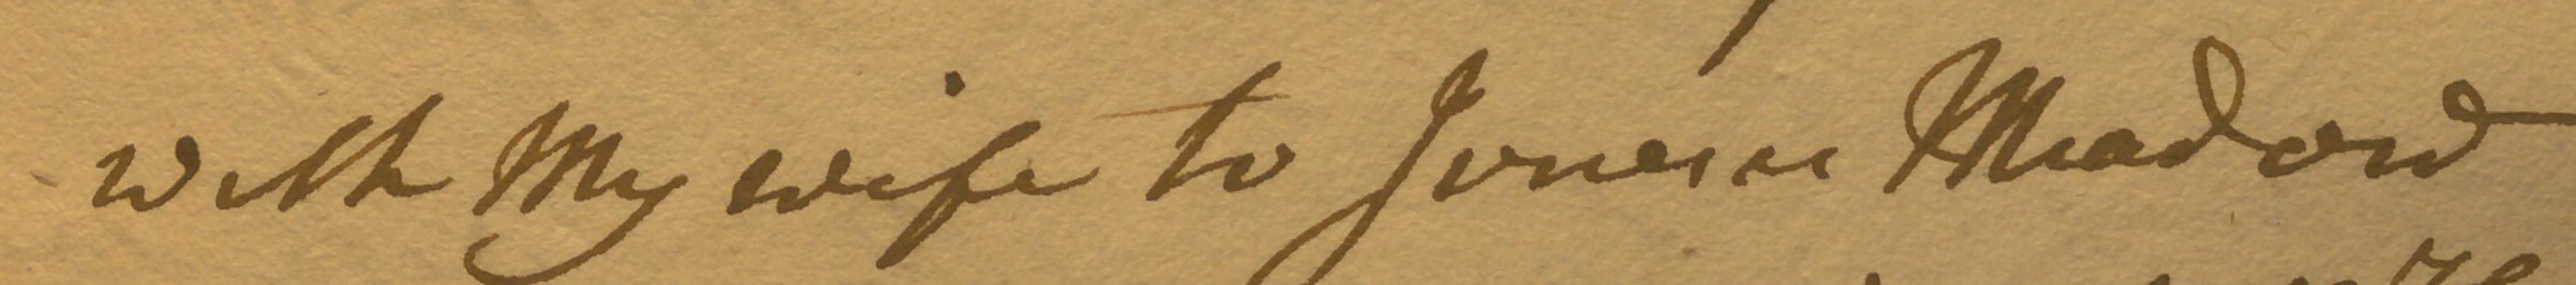with My wife to Joneses Meadow
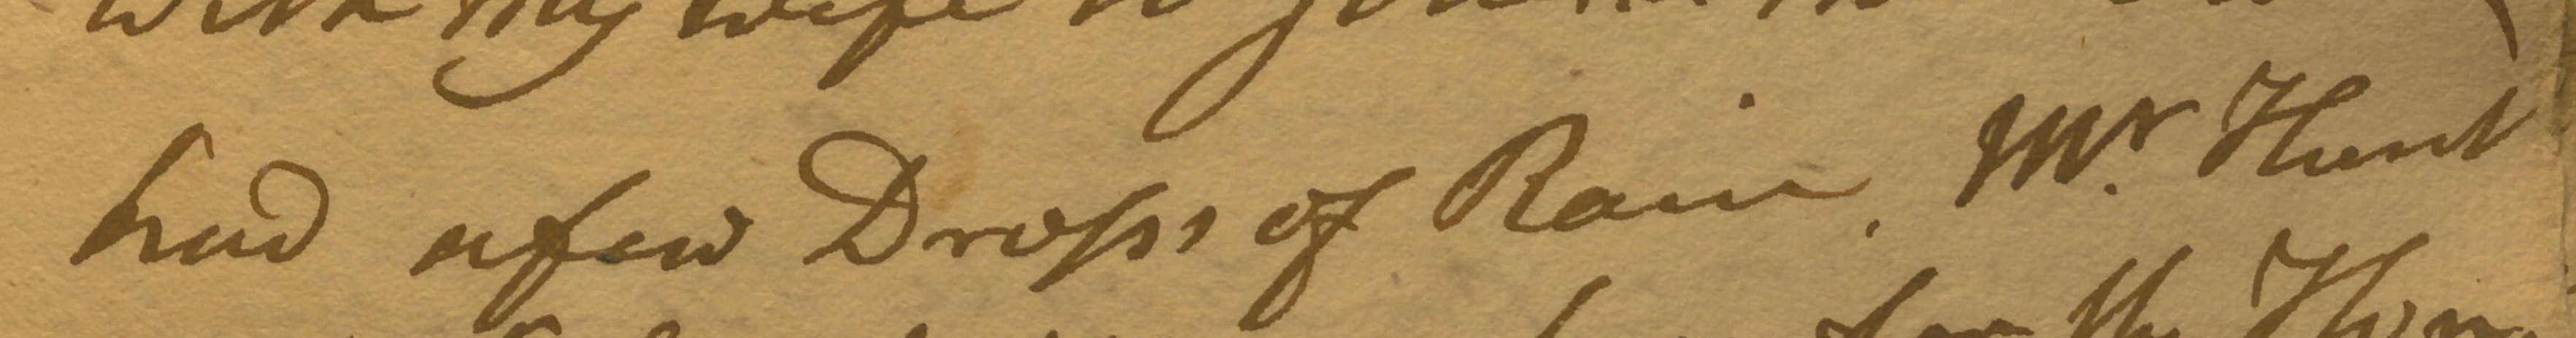had a few Drops of Rain, M^r. Hunt
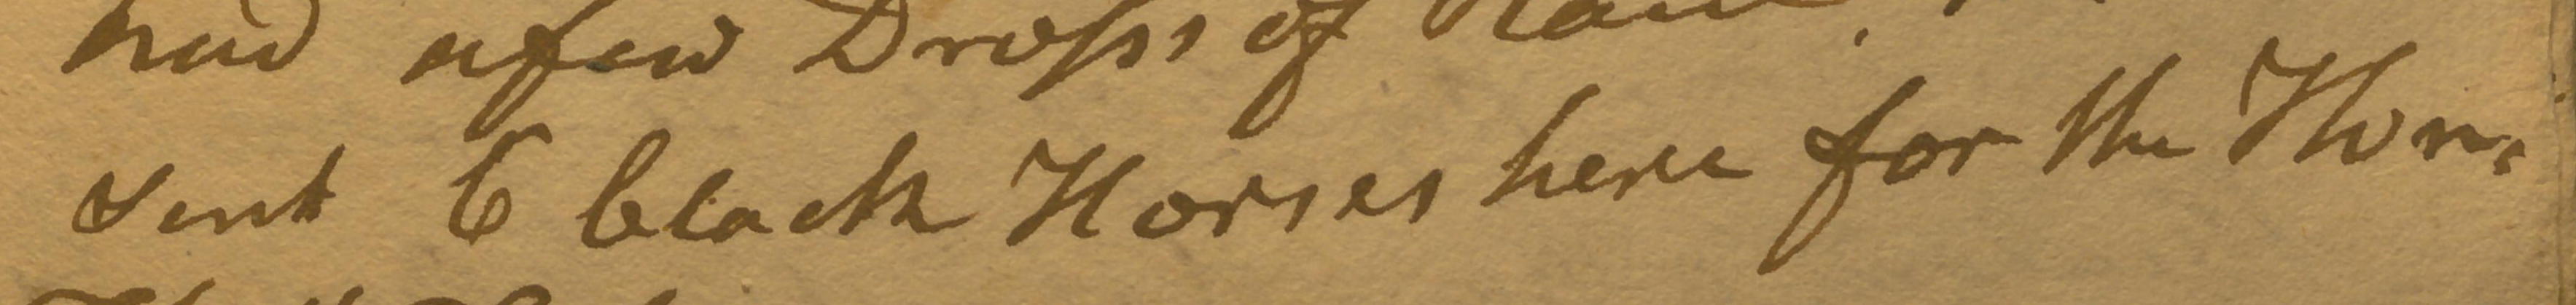sent 6 black Horses here for the Horse
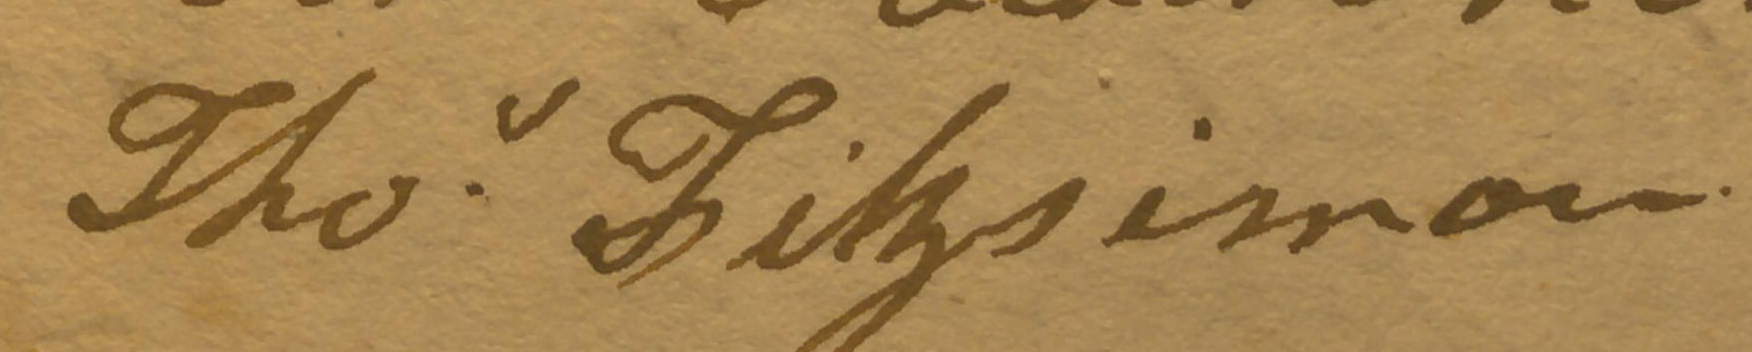Tho^s. Fitzsimon
